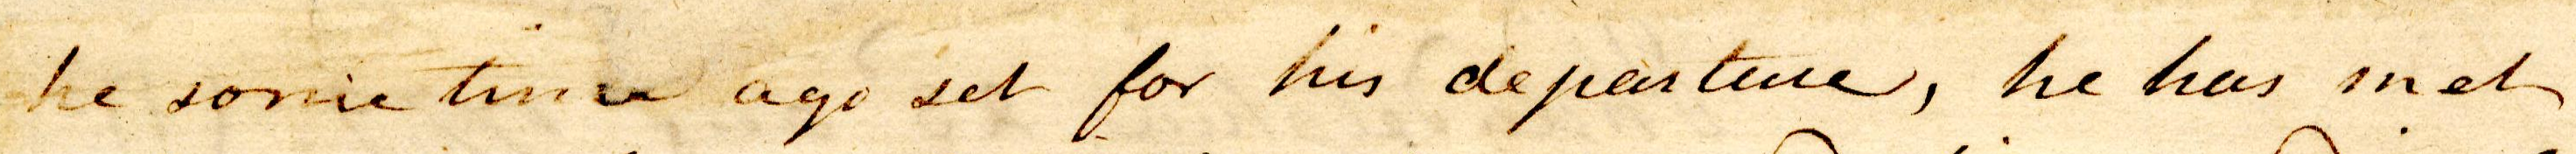he some time ago set for his departure, he has met
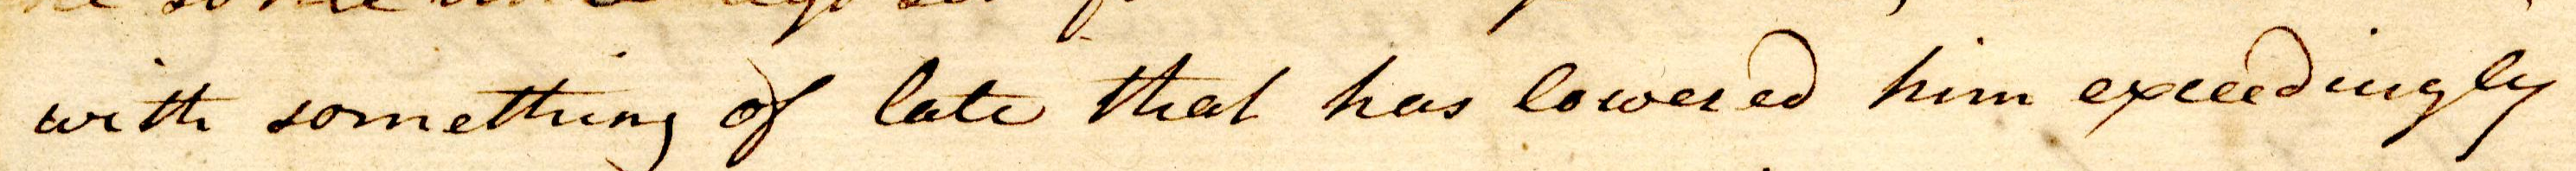with something of late that has lowered him exceedingly
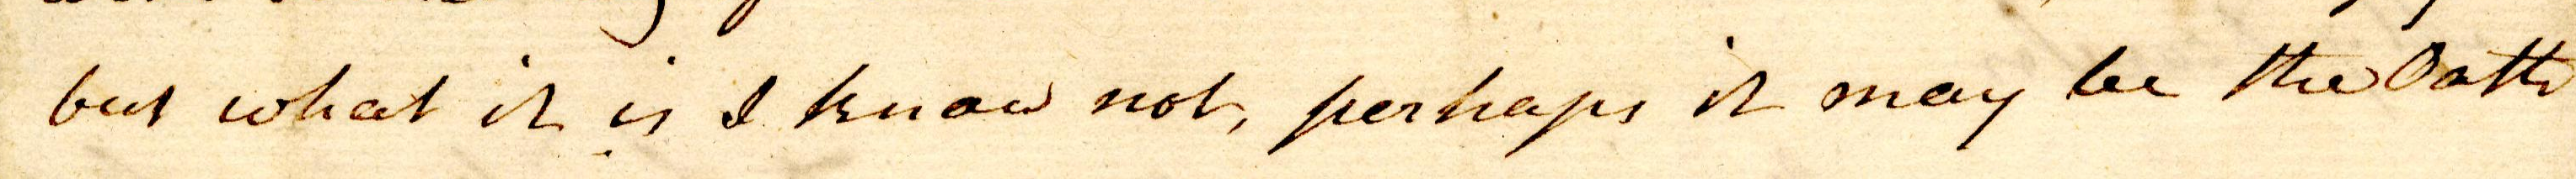but what it is I know not, perhaps it may be the Oath
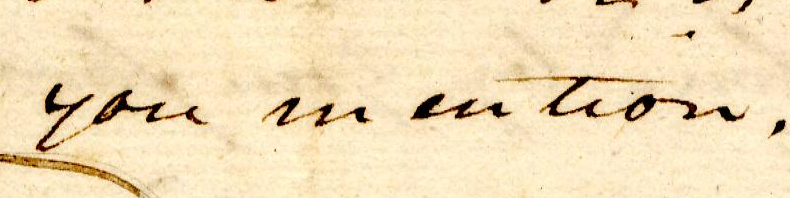you mention
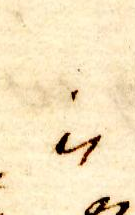is
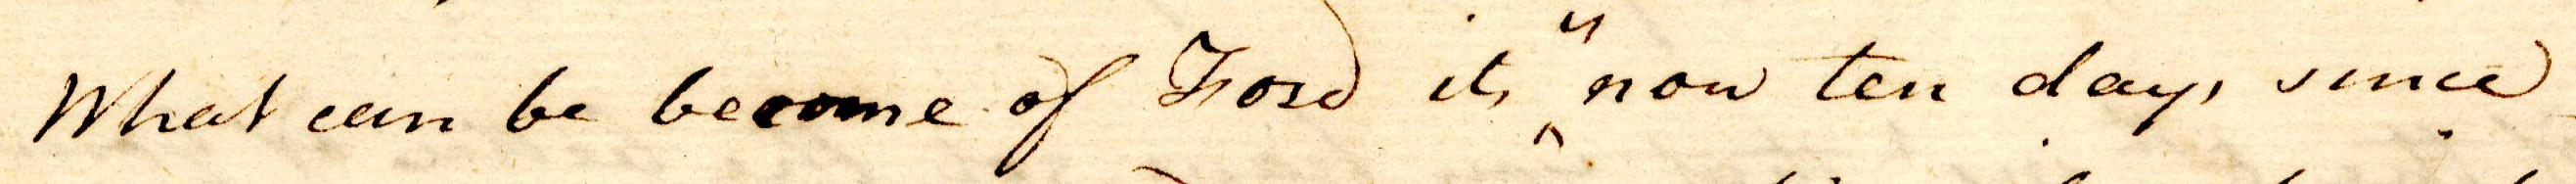What can be become of Ford it ^ now ten days since
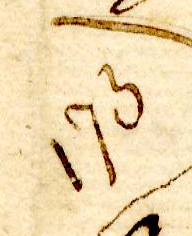173
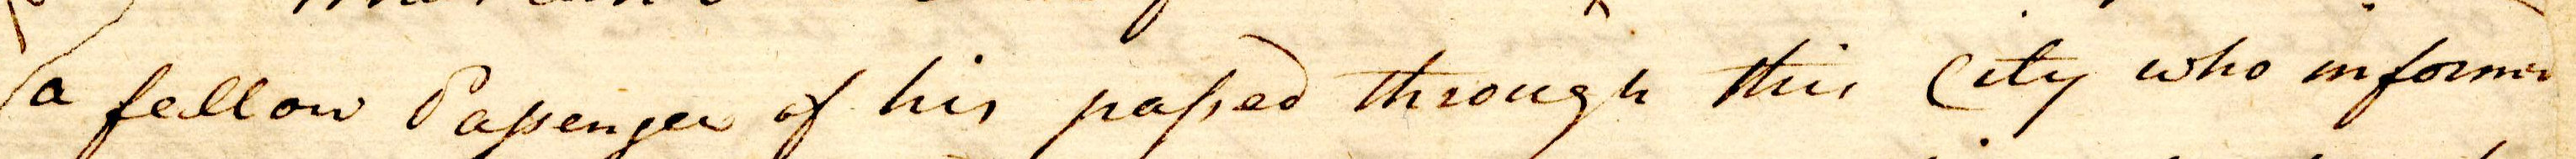a fellow Passenger of his passed through this City who informs
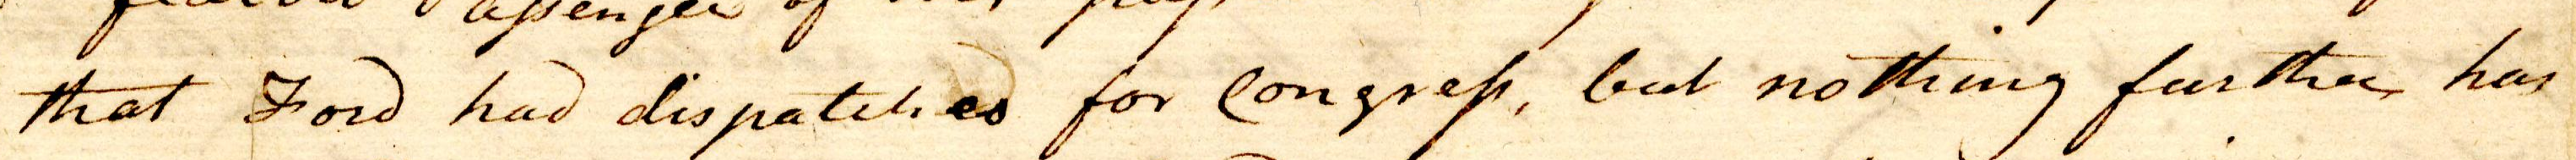that Ford had dispatched for congress, but nothing further has
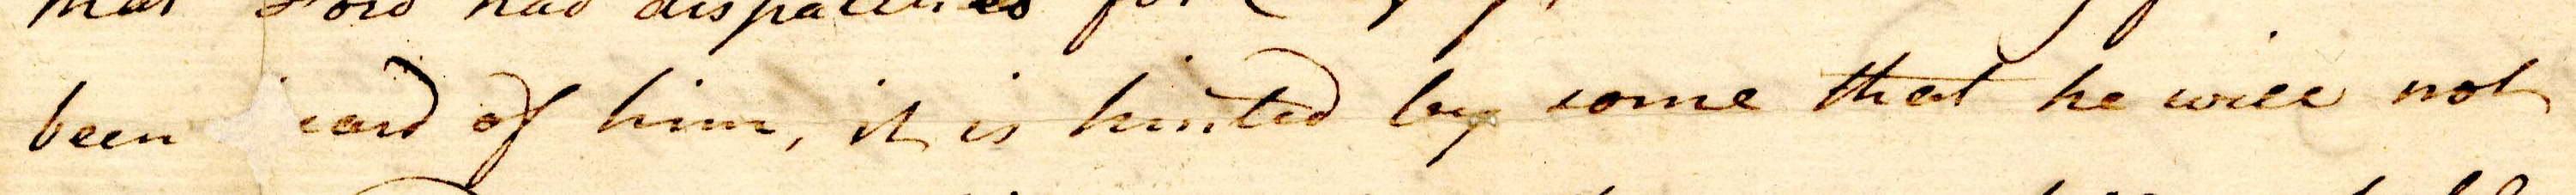been [h]eard of him, it is hinted by come that he will not
